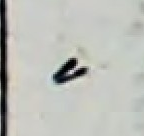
„
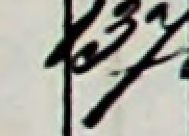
137
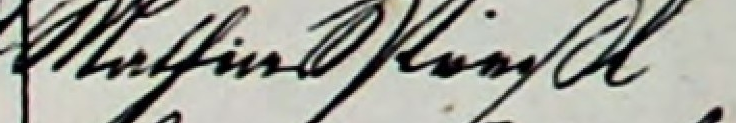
Mathias Preßl
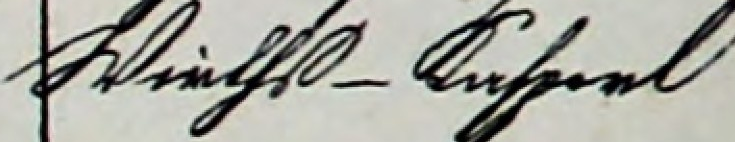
Wirths–Kasperl
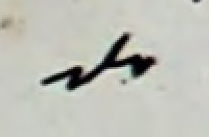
do
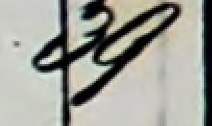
39
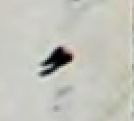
„
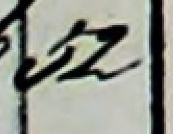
52
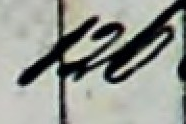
126
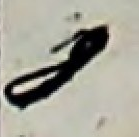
8
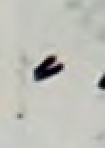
„
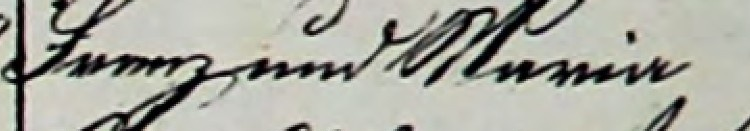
Franz und Maria
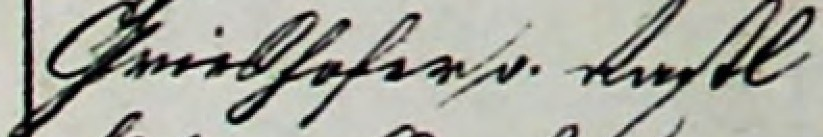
Grieshofer v. Rastl
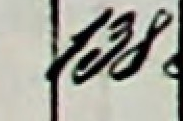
138
